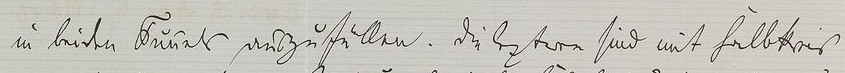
in beiden Tunnels auszufüllen. Die leztern sind mit Halbkreis
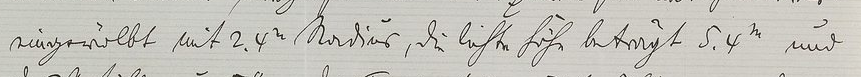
eingewölbt mit 2.4m Radius, die lichte Höhe beträgt 5.4m und
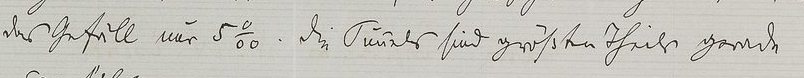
das Gefäll nur 5‰. Die Tunnels sind größten Theils gerade
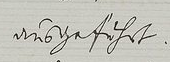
ausgeführt.
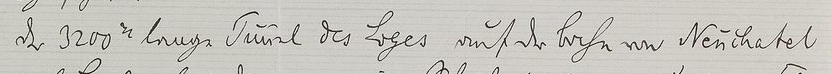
Der 3200m lange Tunnel des Loges auf der Bahn von Neuchatel
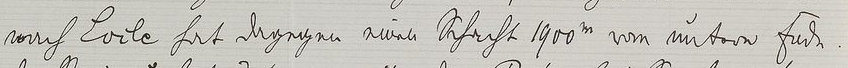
nach Locle hat dagegen einen Schacht 1900m vom untern Ende.
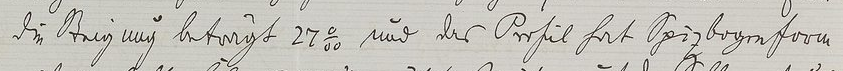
Die Steigung beträgt 27‰ und das Profil hat Spizbogenform
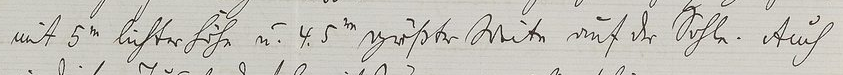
mit 5m lichter Höhe u. 4.5m größter Weite auf der Sohle. Auch
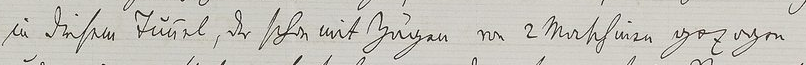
in diesem Tunnel, der schon mit Zügen von 2 Maschinen gezogen
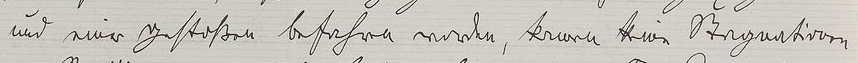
und einer gestoßen befahren worden, kamen keine Stagnationen
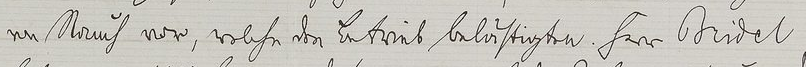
von Rauch vor, welche den Betrieb belästigten. Herr Bridel
